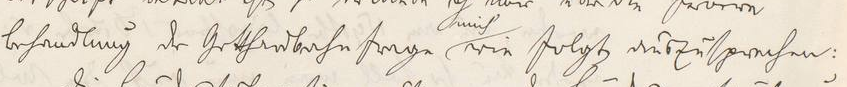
Behandlung der Gotthardbahnfrage mich wie folgt auszusprechen:
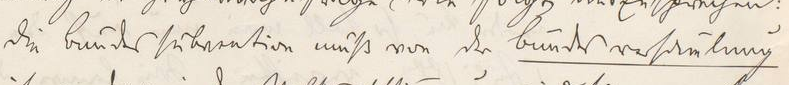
Die Bundessubvention muß von der Bundesversammlung
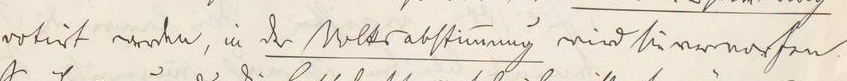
votirt werden, in der Volksabstimmung wird sie verworfen.
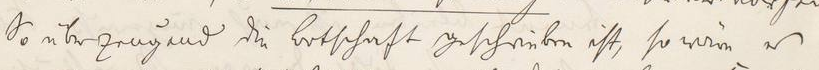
So überzeugend die Botschaft geschrieben ist, so wäre es
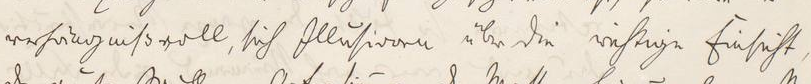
verhängnisvoll, sich Illusionen über die richtige Einsicht,
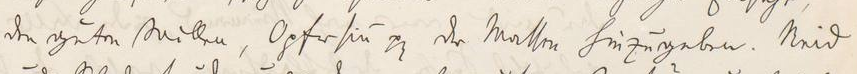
den guten Willen, Opfersinn pp der Massen hinzugeben. Neid
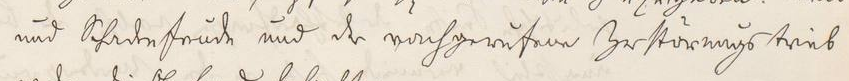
und Schadenfreude und der wachgerufene Zerstörungstrieb
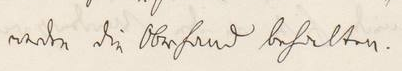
werden die Oberhand behalten.
